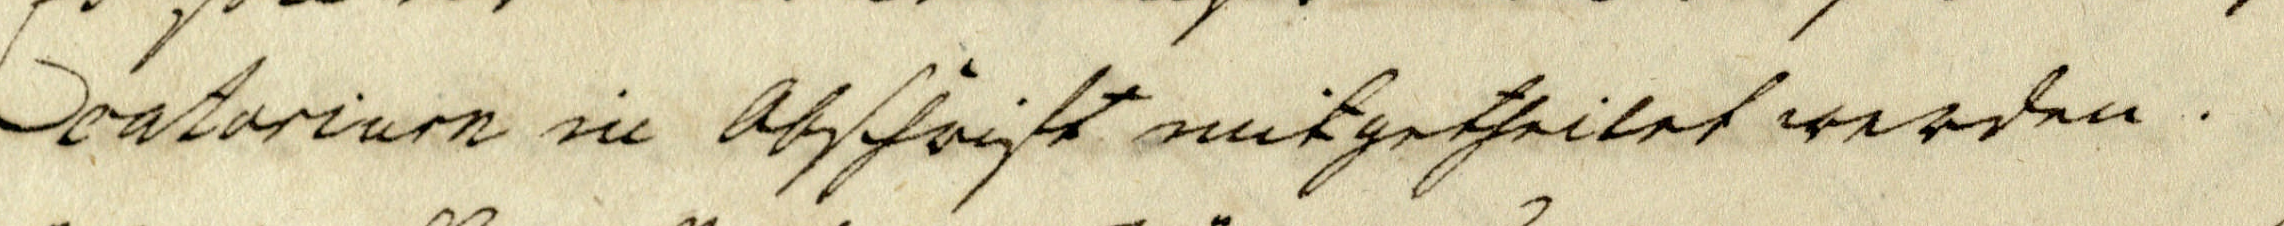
catorium in Abschrift mitgetheilet werden.
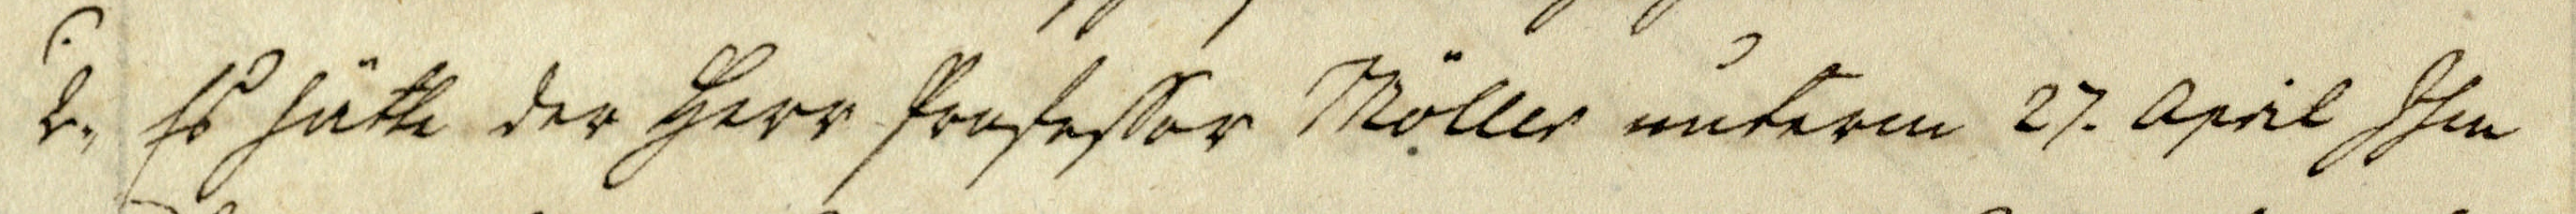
2. Es hätte der Herr Professor Möller unterm 27. April Ihm
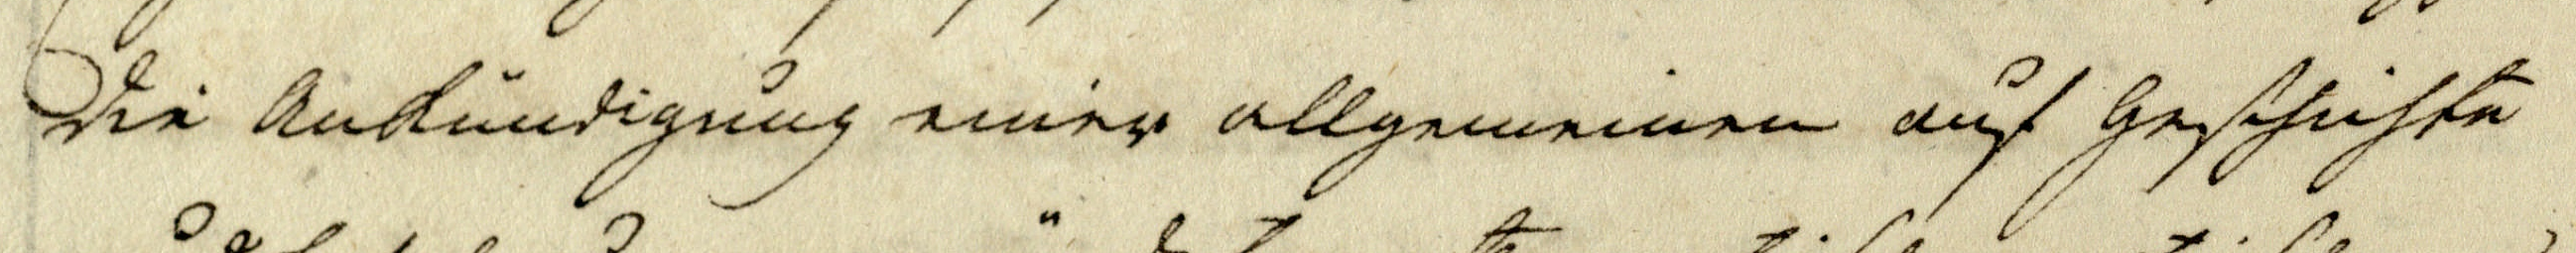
die Ankündigung einer allgemeinen auf Geschichte
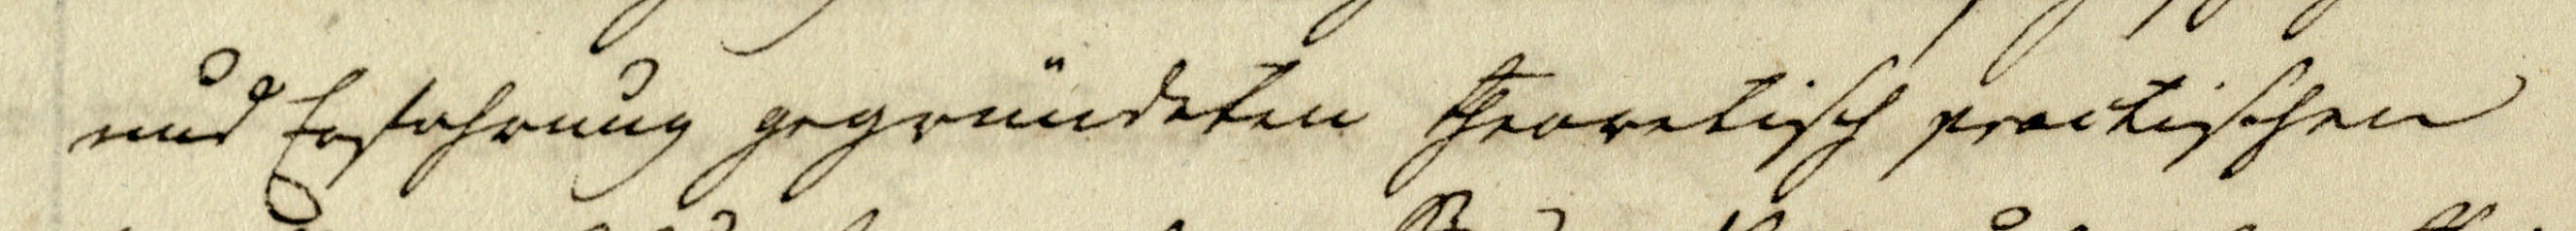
und Erfahrung gegründeten theoretisch practischen
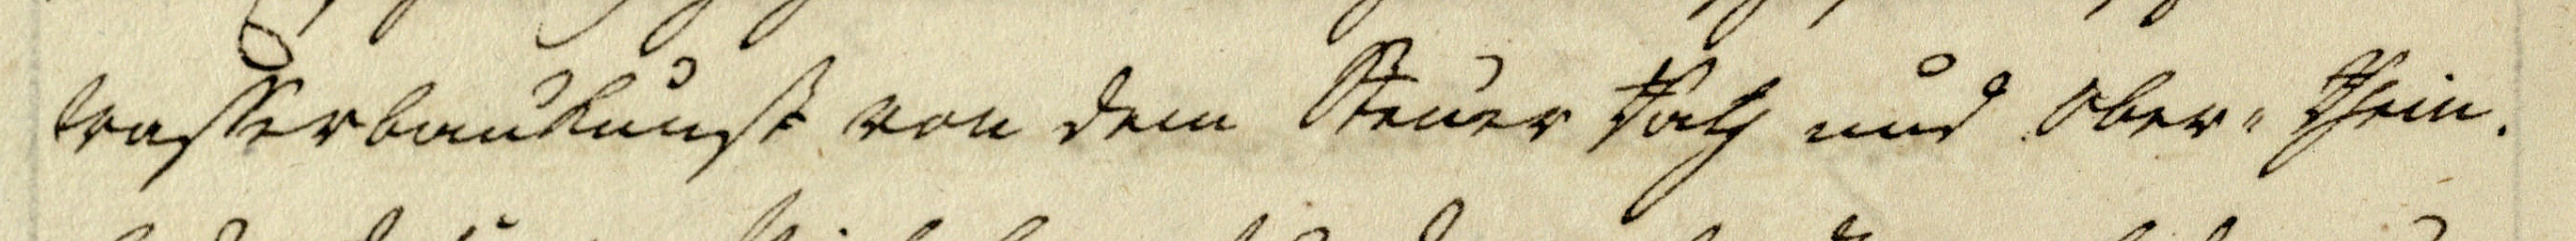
Wasserbaukunst von dem Steuer Rath und Ober- Rhein¬
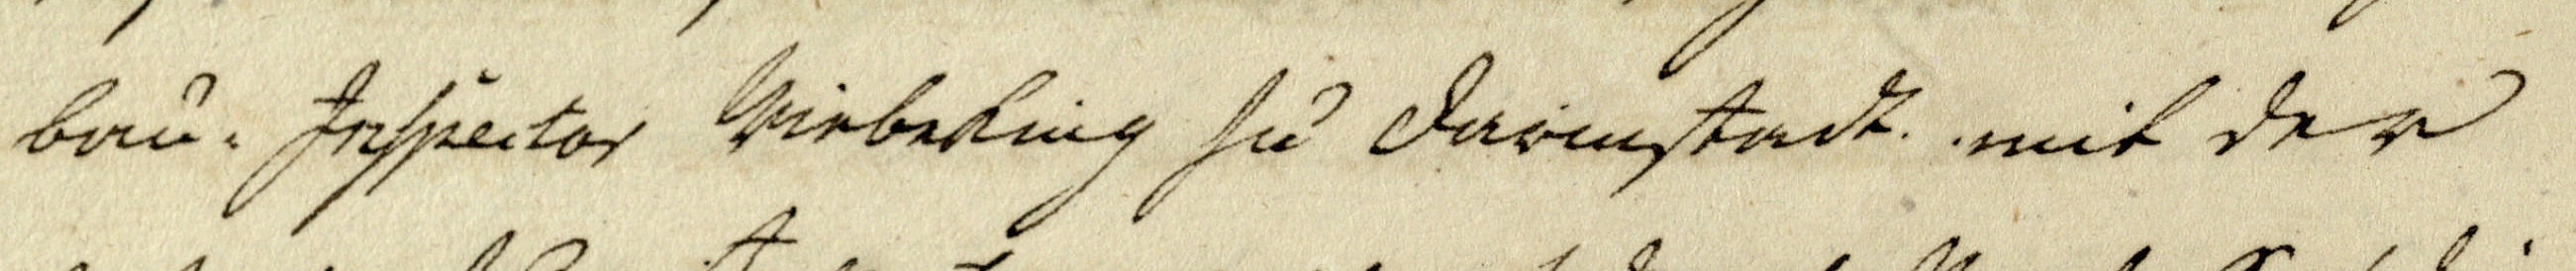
Bau- Inspector Wiebeking zu Darmstadt mit der
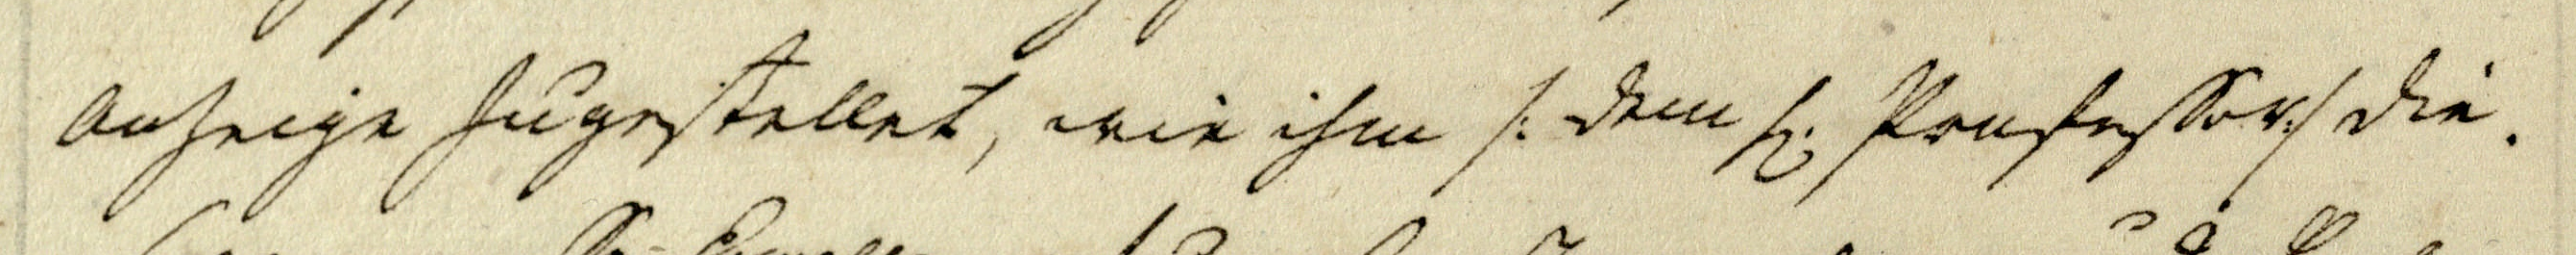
Anzeige zugestellet, wie ihm /: dem h. Professor ./ die¬
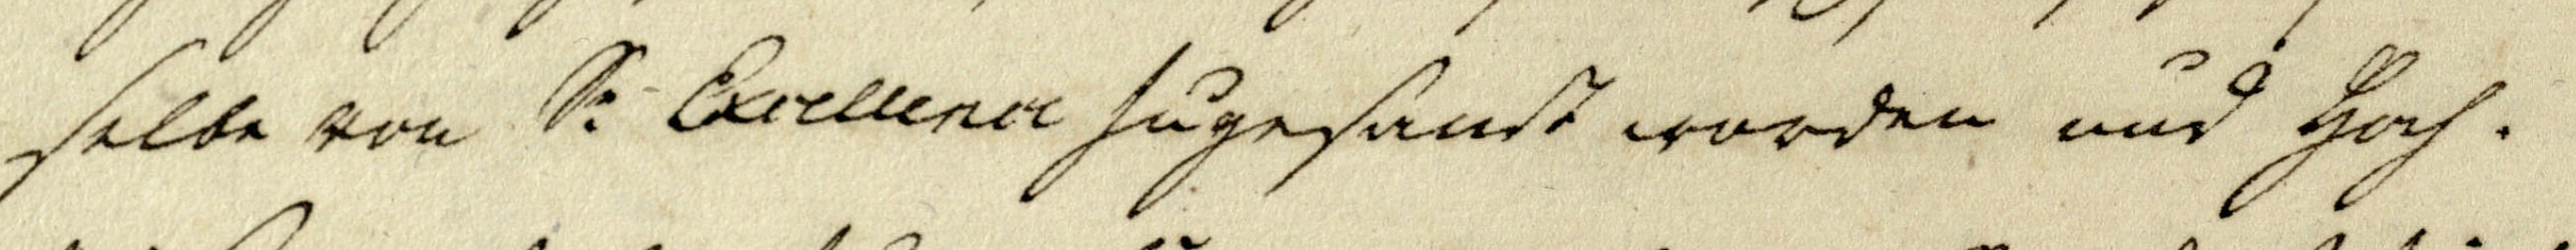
selbe von Sr. Excellence zugesandt worden und Hoch¬
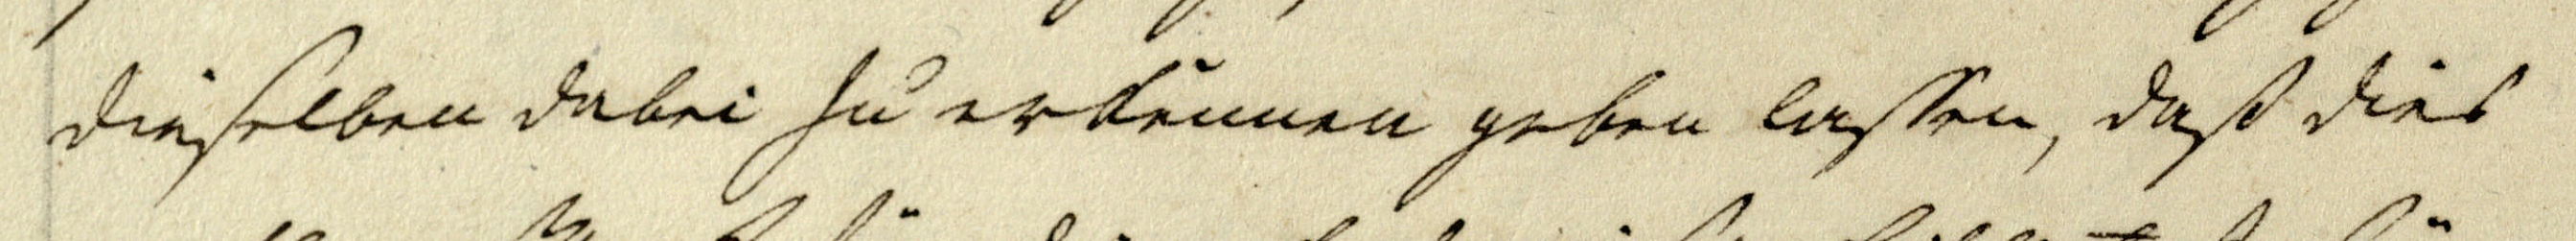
dieselben dabei zu erkennen geben lassen, daß dies
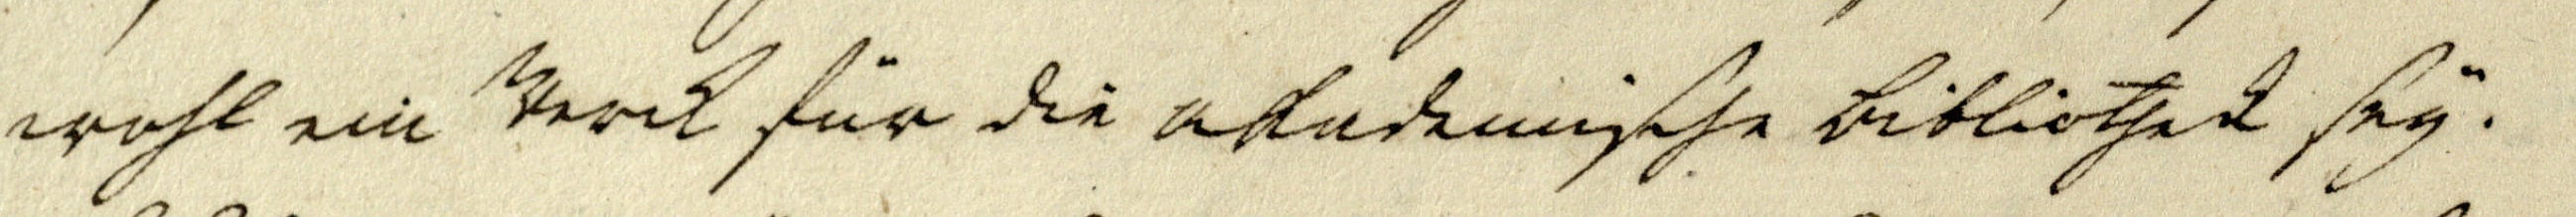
wohl ein Werck für die akademische Bibliothek seÿ.
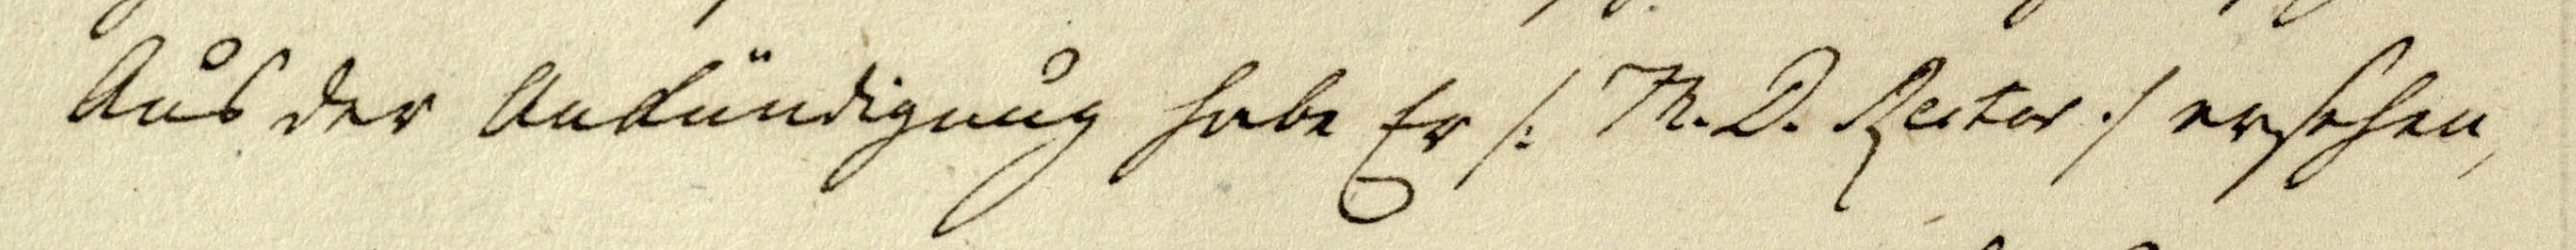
Aus der Ankündigung habe Er /: M. D. Rector ./ ersehen,
